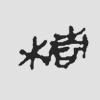棈
